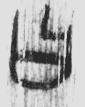曰
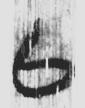㠯（以）
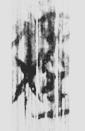穜（種）
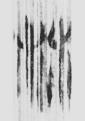○（麻）
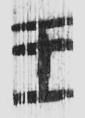王
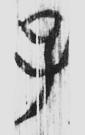子
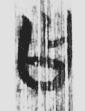曰
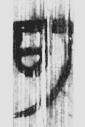可（何）
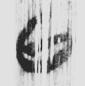㠯（以）
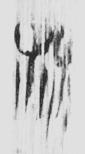○（麻）
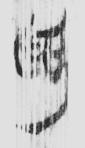爲
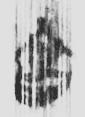○（答）
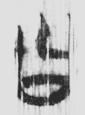曰
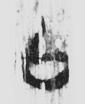㠯（以）
